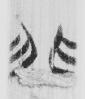非
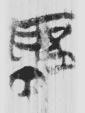{耳襾呈}
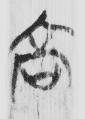高
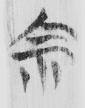宗
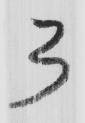乃
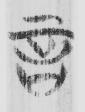言
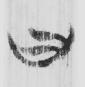曰
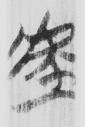𫊟
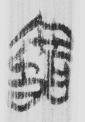{尒䎽}
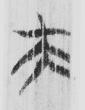夫
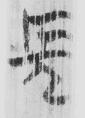長
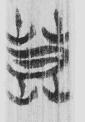莫
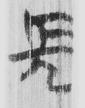長
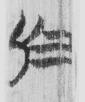於
